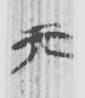亓
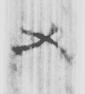又
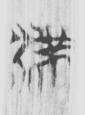港
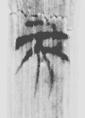天
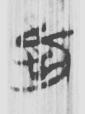{旡心}
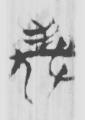{毛人戈}
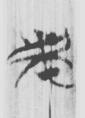民
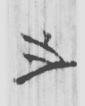之
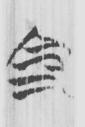命
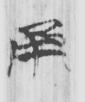甬
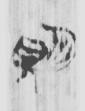{見勿}
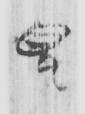見
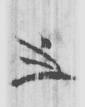之
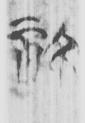祅
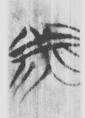羕
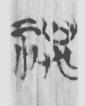{示萬}
